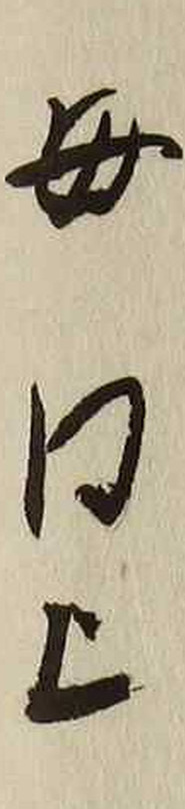母同上
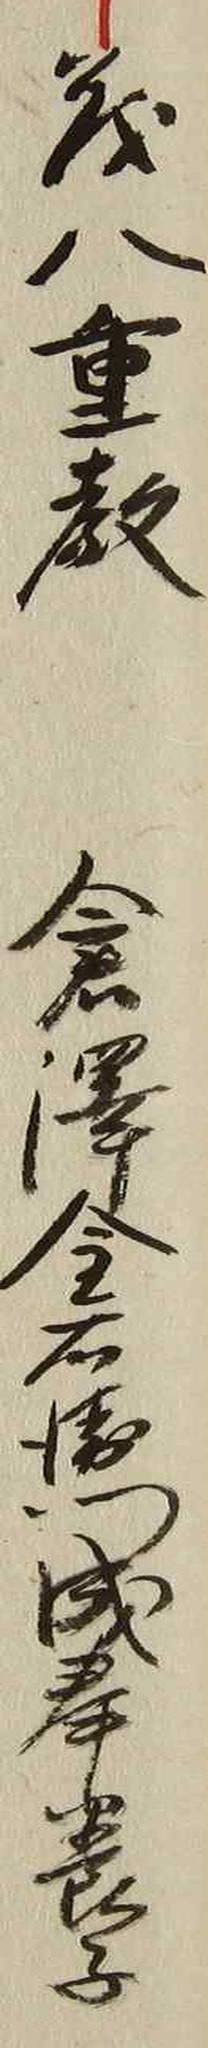茂八重教倉沢金右衛門成奉養子
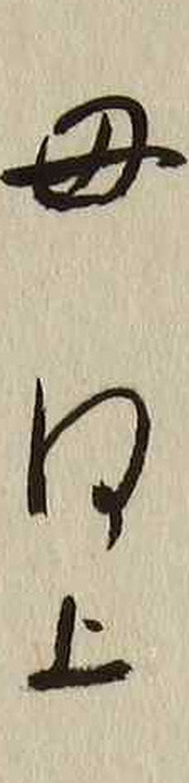母同上
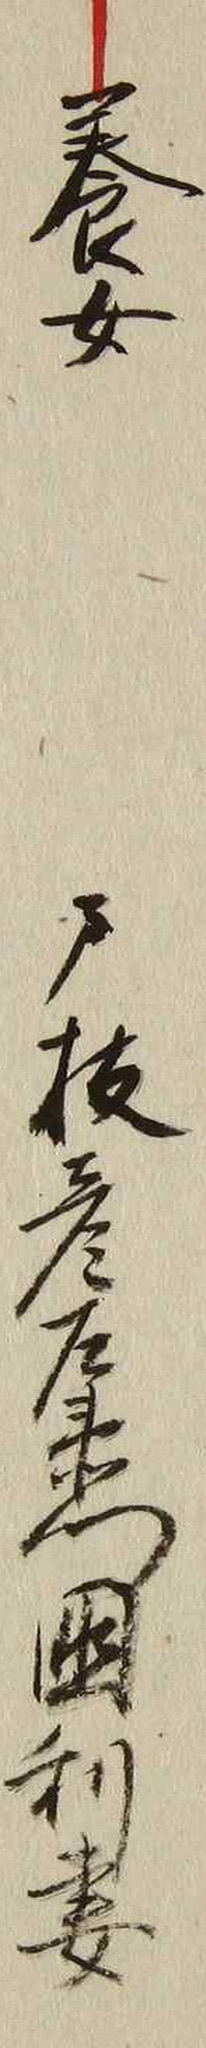養女戸枝彦左衛門国利妻
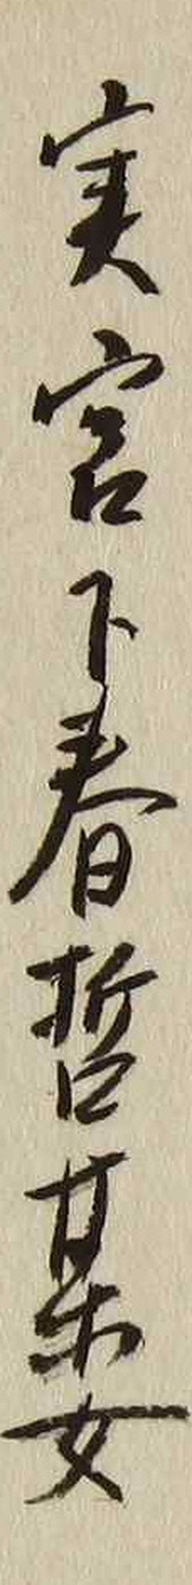実宮下春哲某女
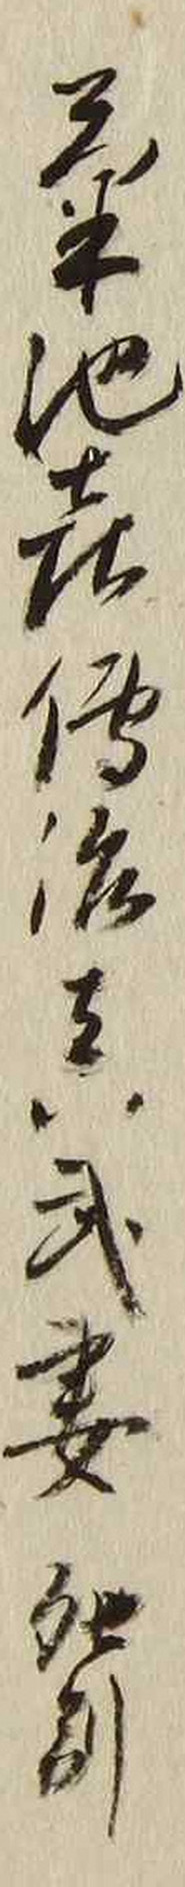女菊池喜伝治真武妻死別
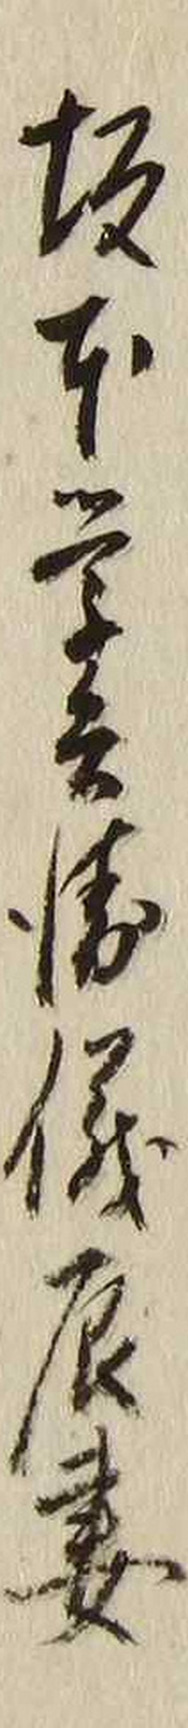坂本学兵衛儀辰妻
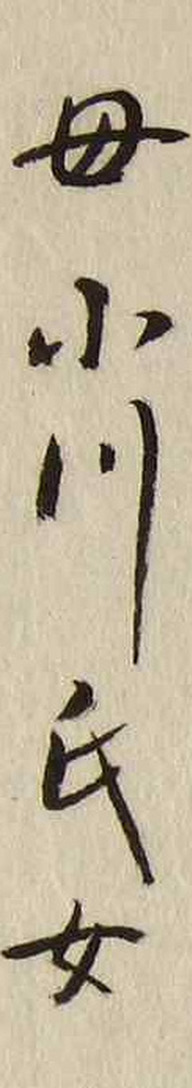母小川氏女

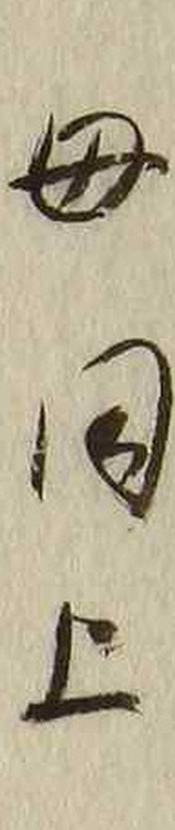母同上
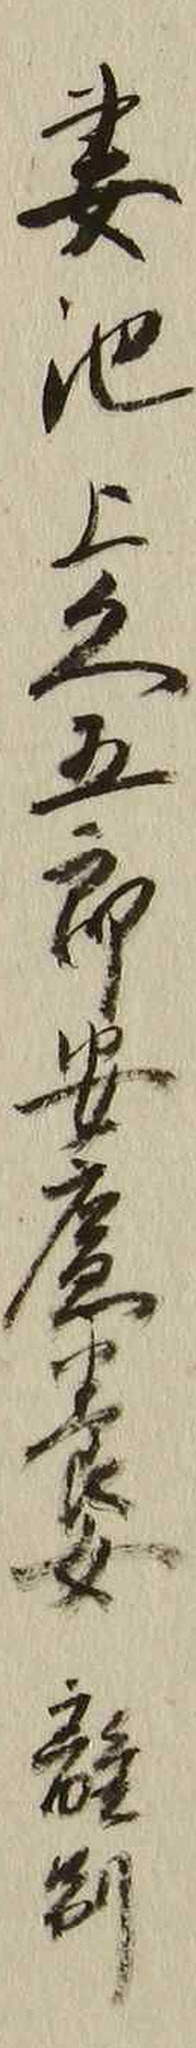妻池上久五郎安廉養女離別
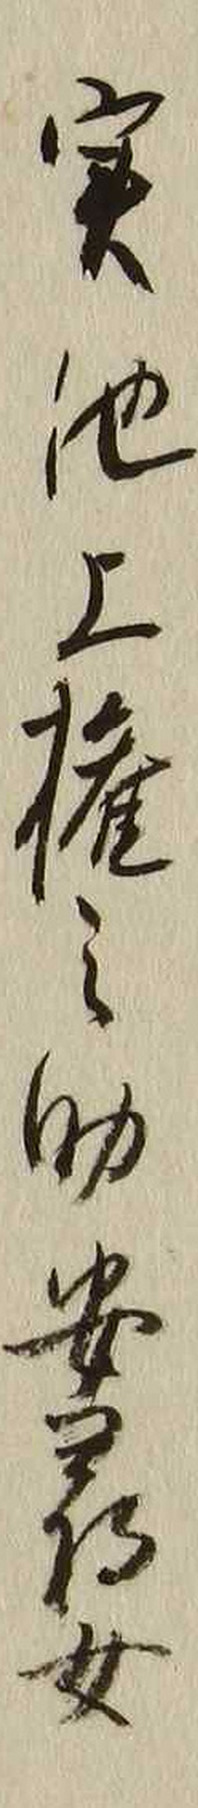実池上権之助安尋女
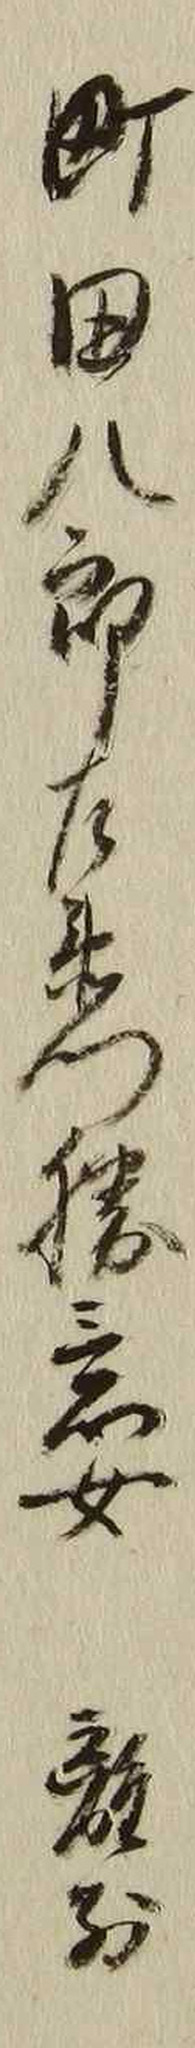町田八郎左衛門勝意女離別
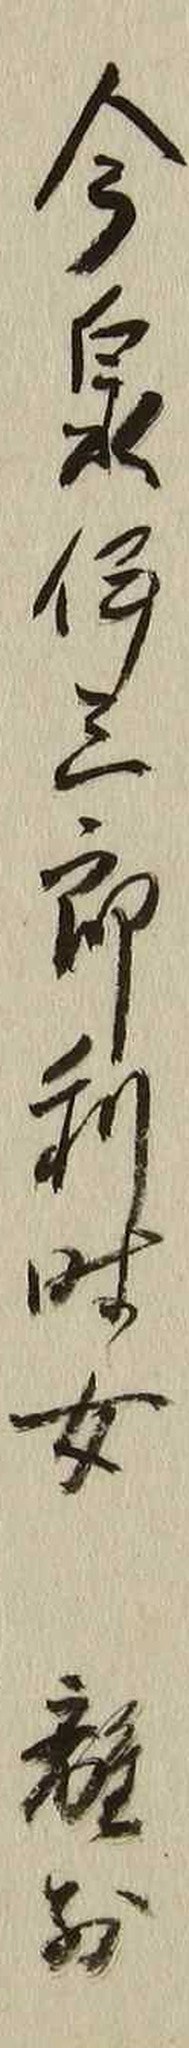今泉伊三郎利時女離別
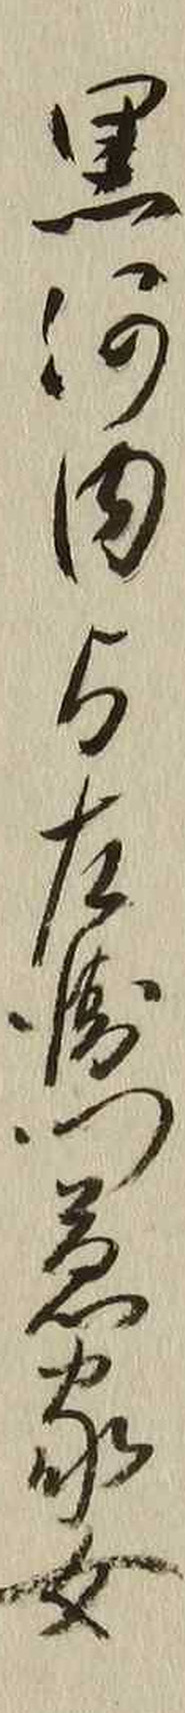黒河内与左衛門兼家女
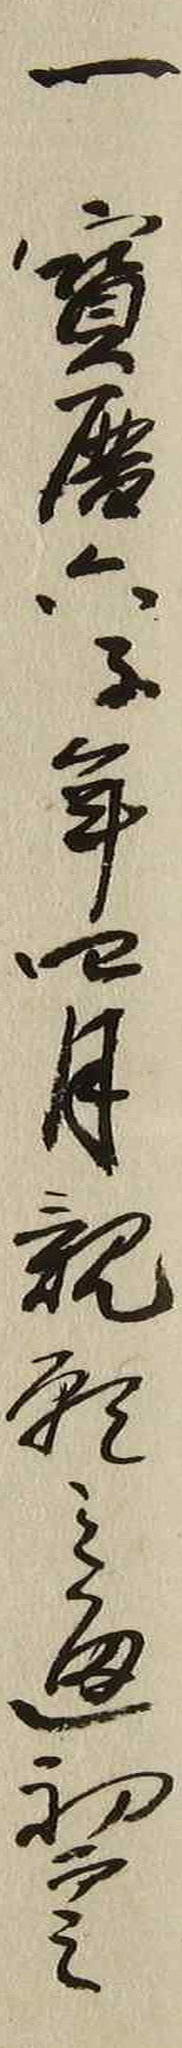一宝暦六子年四月親願之通初而之
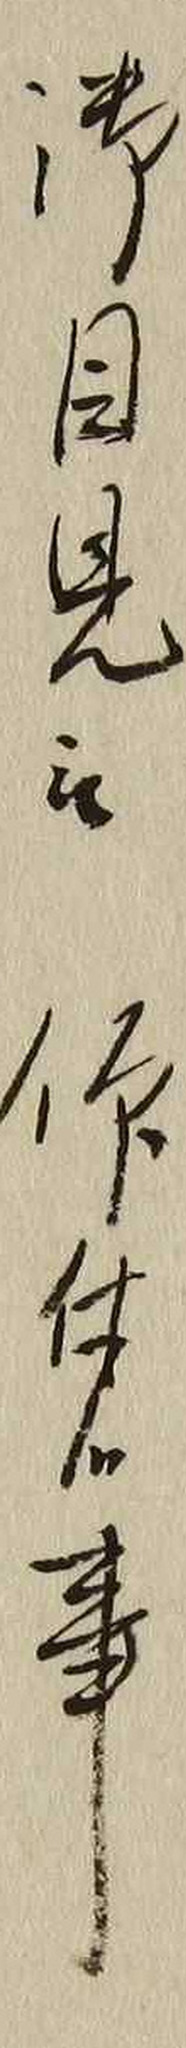御目見被仰付候事
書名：諸士系譜　巻之346　も之部2
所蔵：会津若松市立会津図書館
